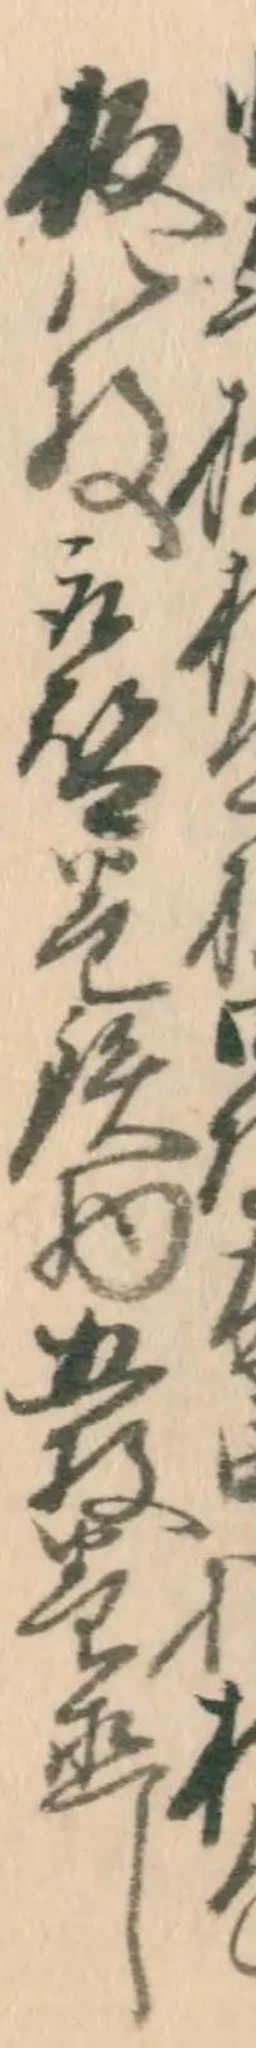板八枚取替巻鉄物五枚巻直し
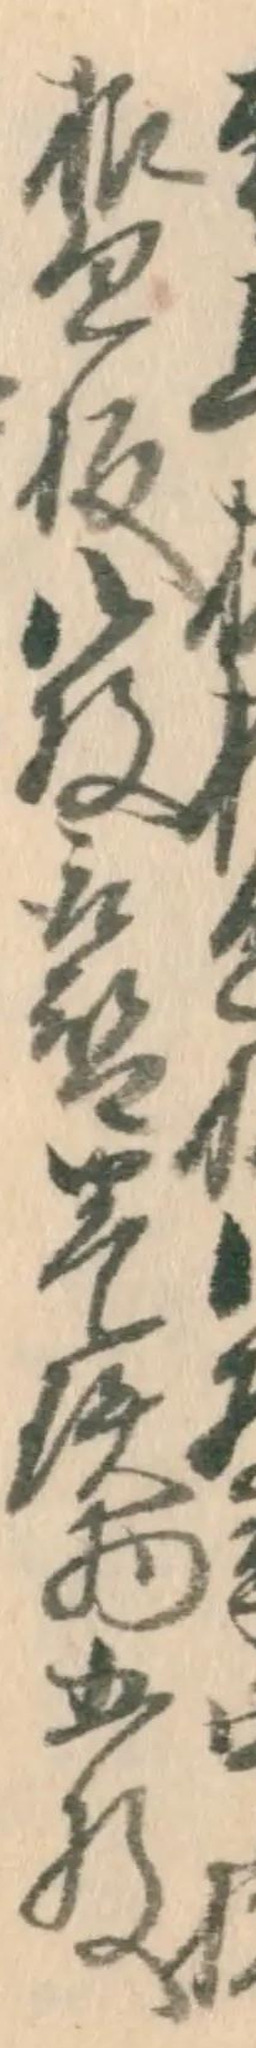根包板八枚取替巻鉄物五枚
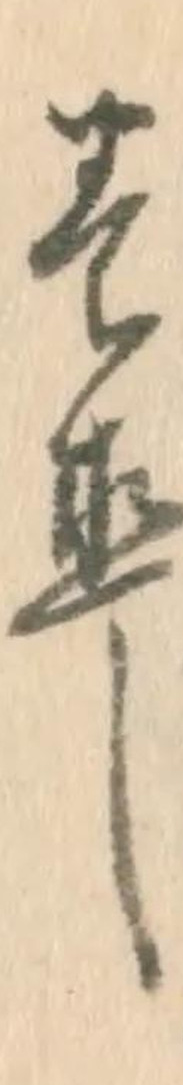巻直し
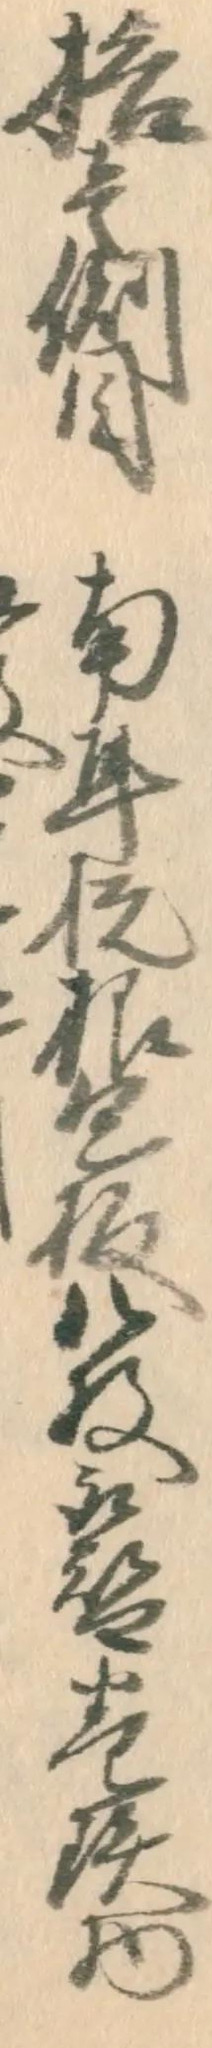拾壱側目南耳杭根包板八枚取替巻鉄物
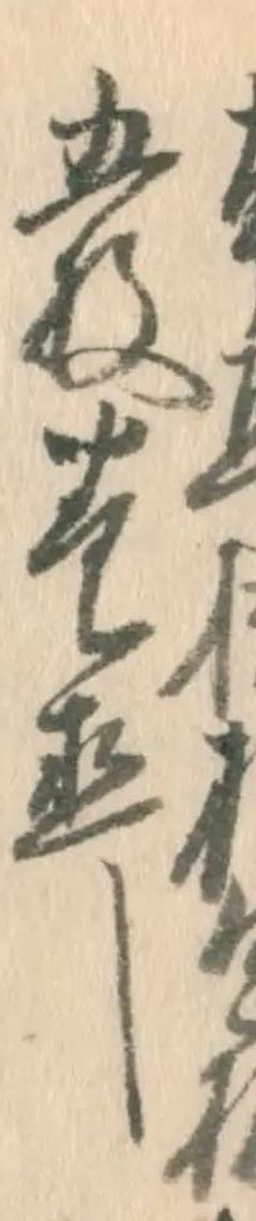五枚巻直し
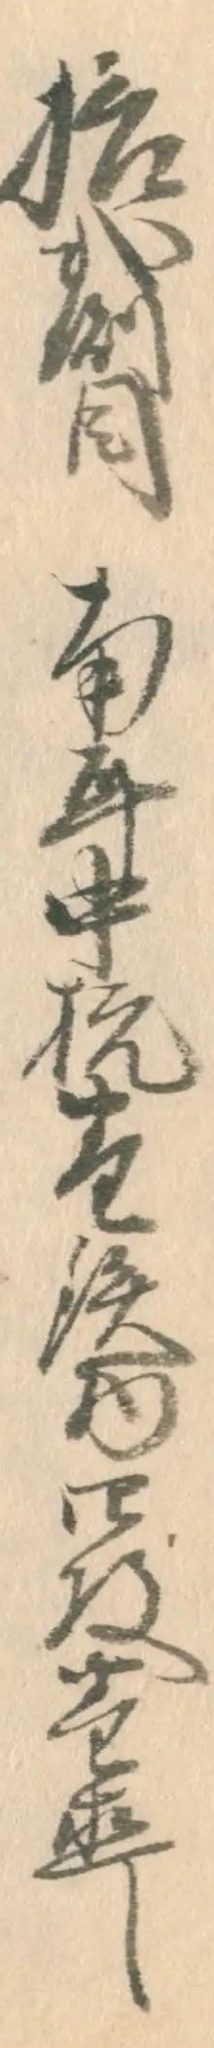拾弐側目南耳中杭巻鉄物四枚巻直し
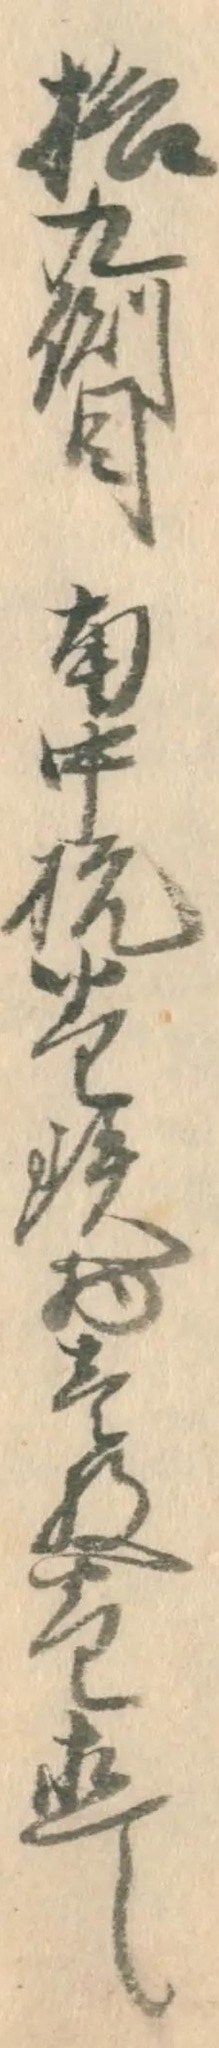拾九側目南中杭巻鉄物壱枚巻直し

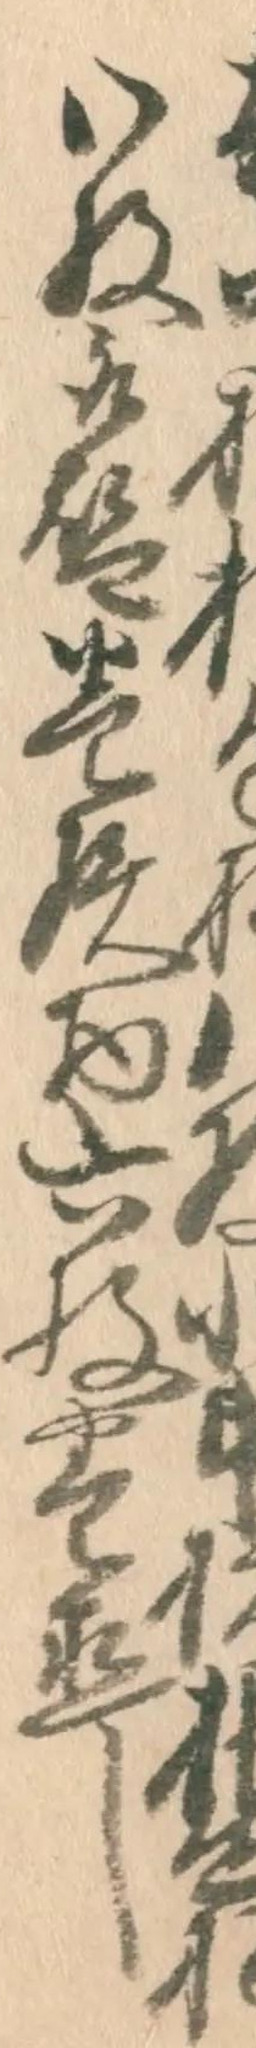八枚取替巻鉄物六枚巻直し
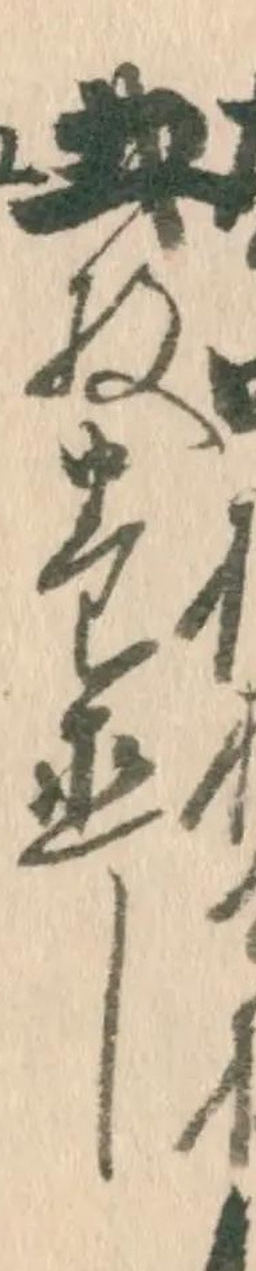五枚巻直し
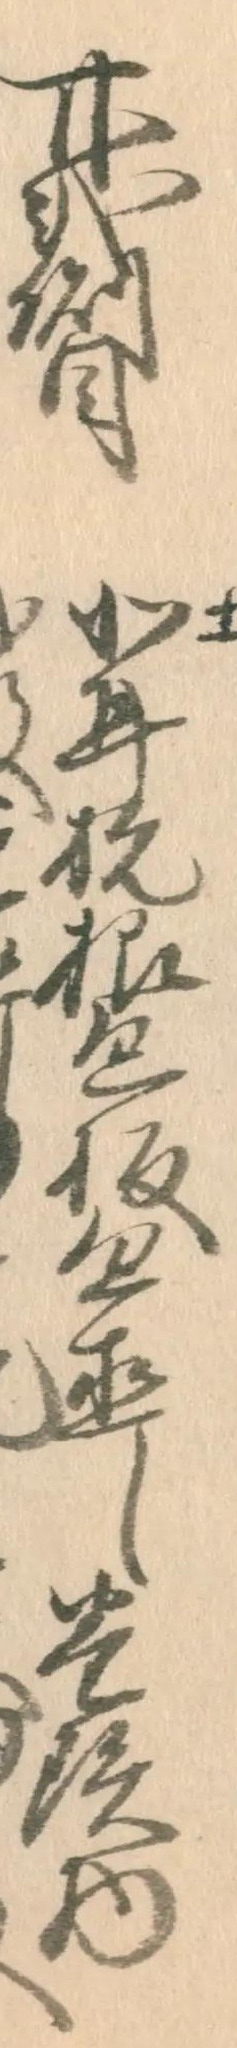廿弐側目北耳杭根包板包直し巻鉄物
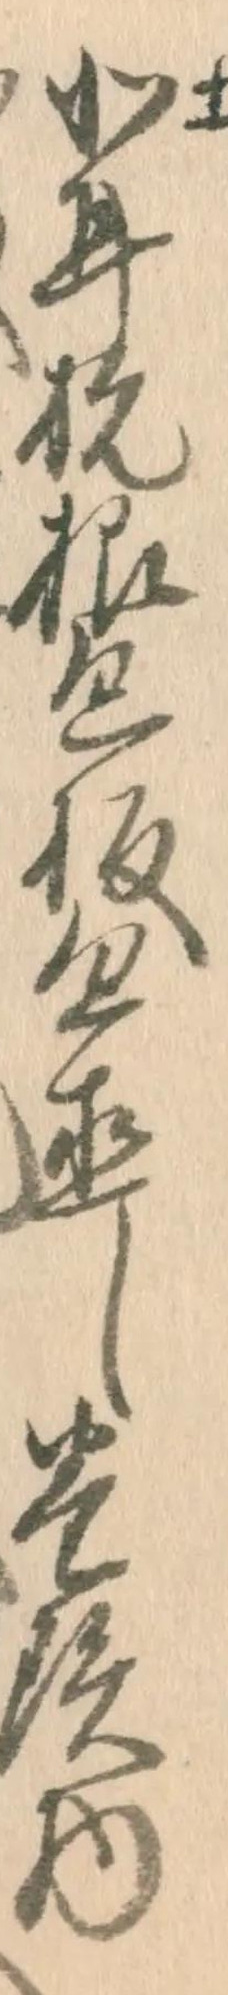廿弐側目北耳杭根包板包直し巻鉄物
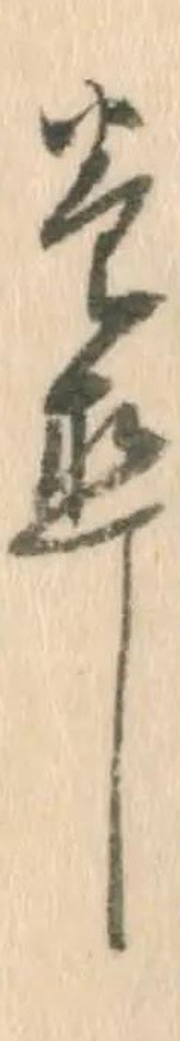巻直し
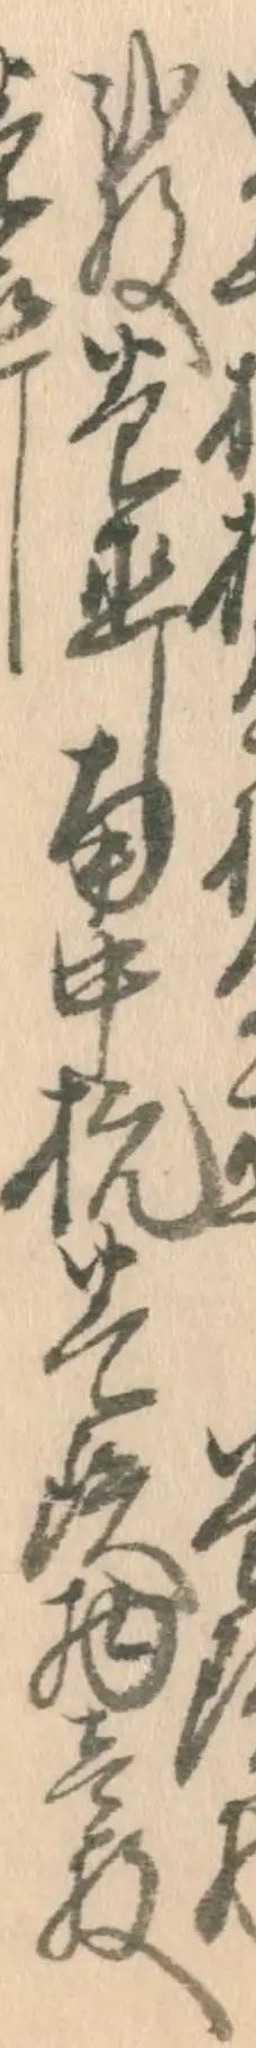弐枚巻直し南中杭巻鉄物壱枚
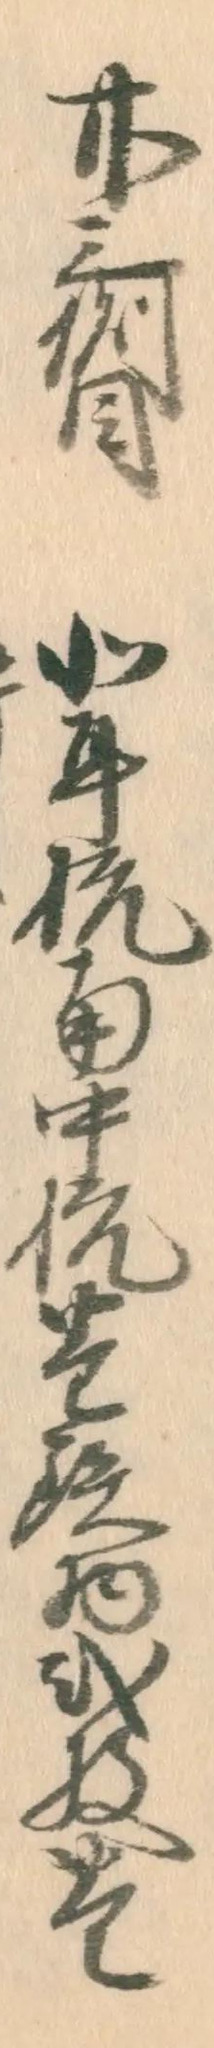廿三側目北耳杭南中杭巻鉄物弐枚巻
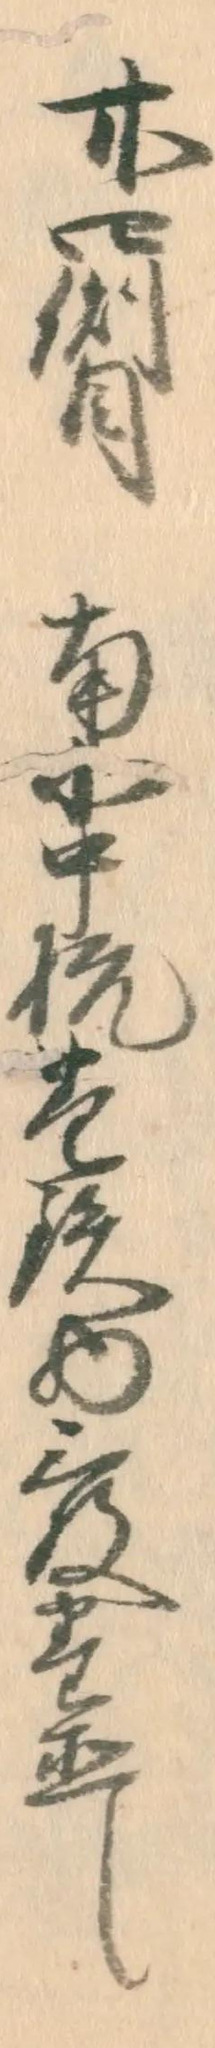廿四側目南北中杭巻鉄物三枚巻直し
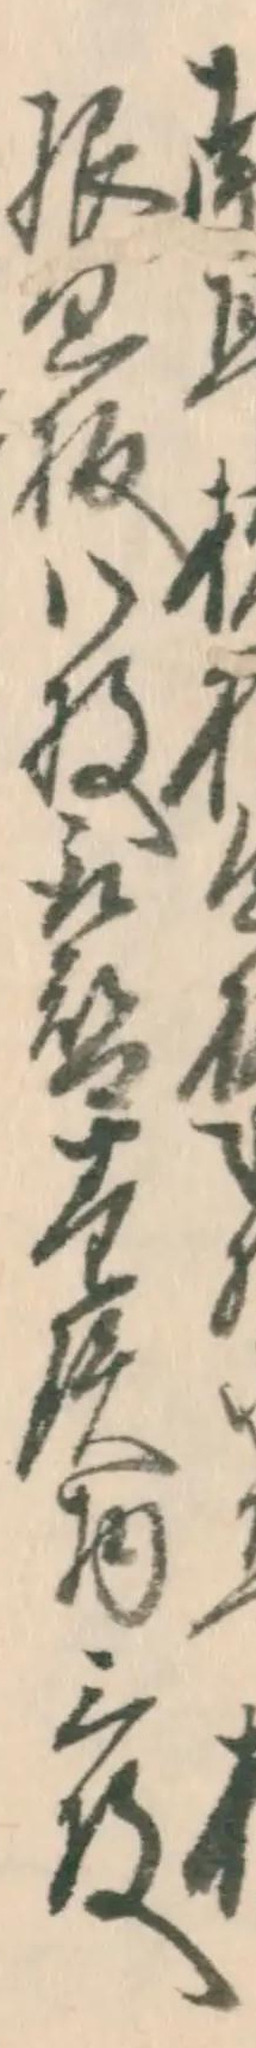根包板八枚取替巻鉄物三枚
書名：三橋 17巻. [7] 三橋小破御修復書留　但御奉行御掛リ替地震潰橋番屋　嘉永四亥年より安政二卯年迄　上
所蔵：国立国会図書館 National Diet Library, JAPAN
